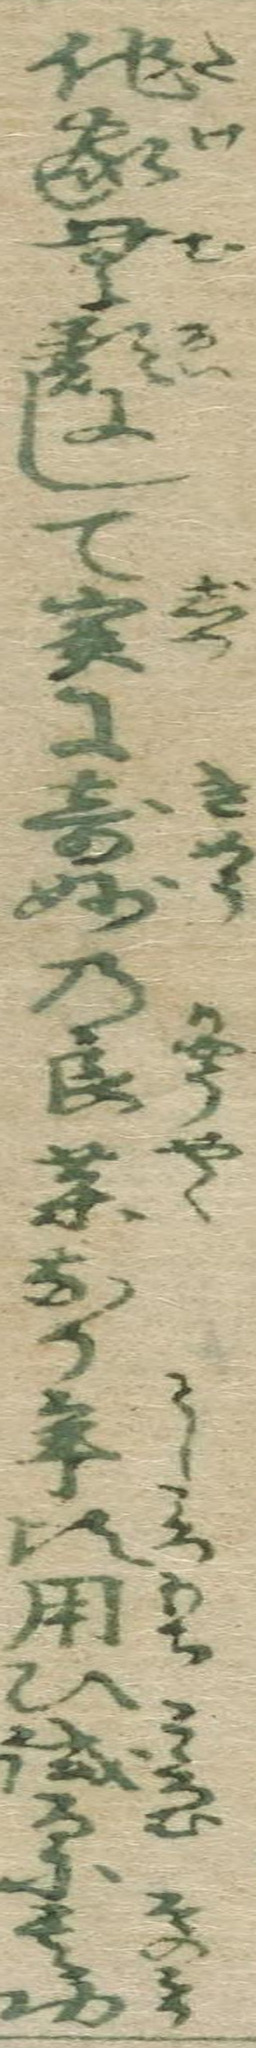他家無類にして実に奇妙の良薬なり年頃用ひ試るに其功
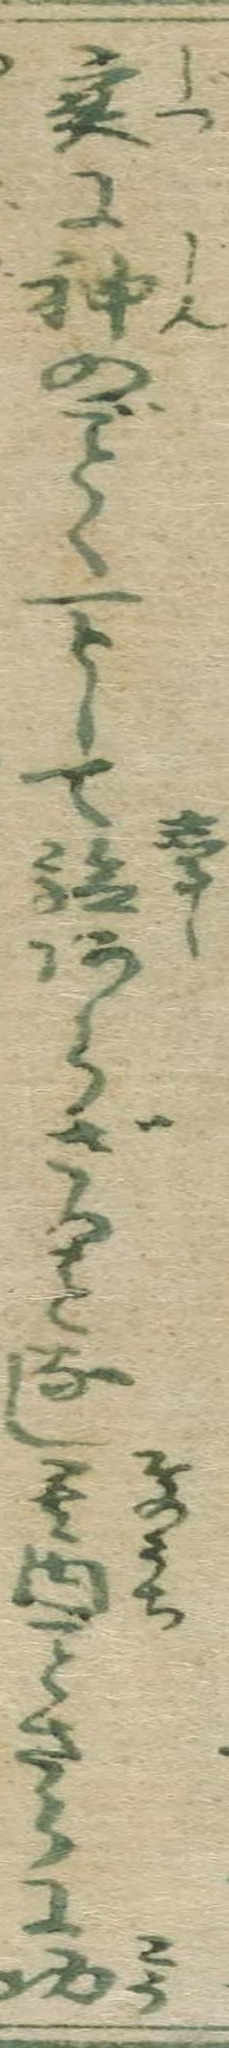実に神のごとく一として験あらざることなし其内ことさらに効
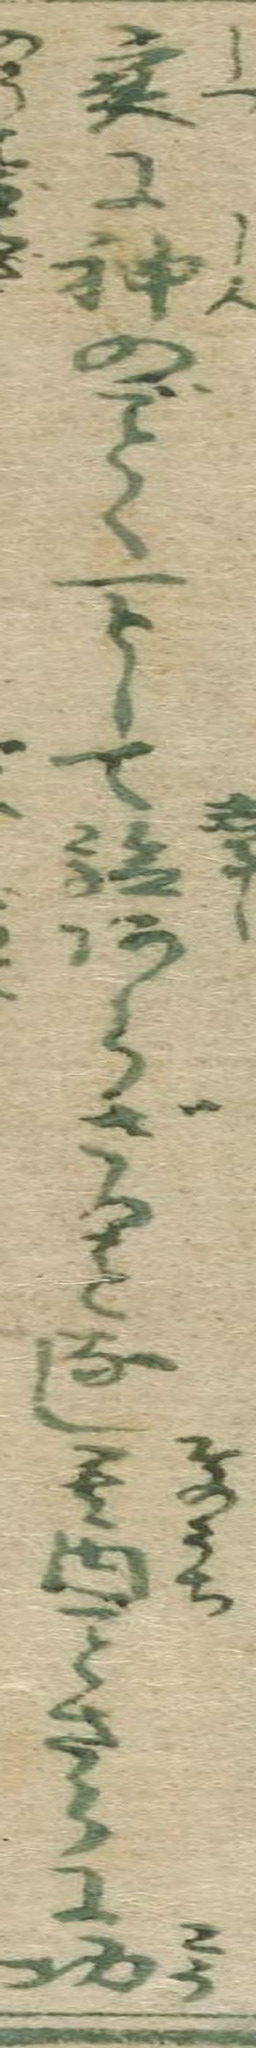実に神のごとく一として験あらざることなし其内ことさらに効
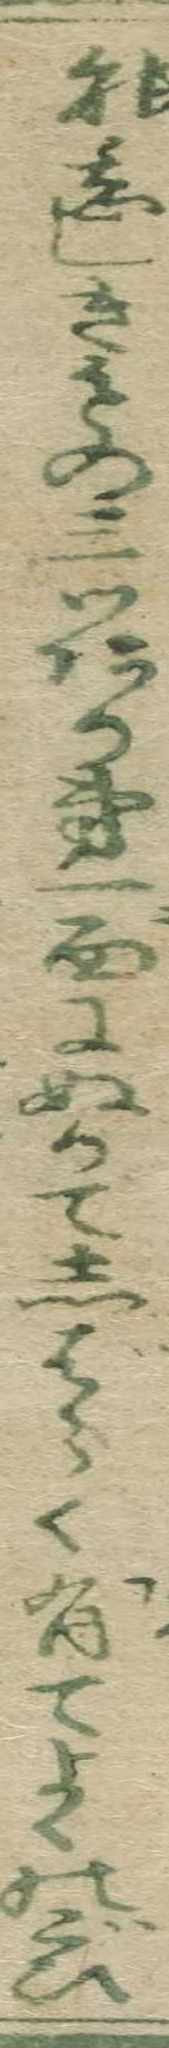能甚しきもの三ツあり第一面にぬりてしばらく有てよくのごひ
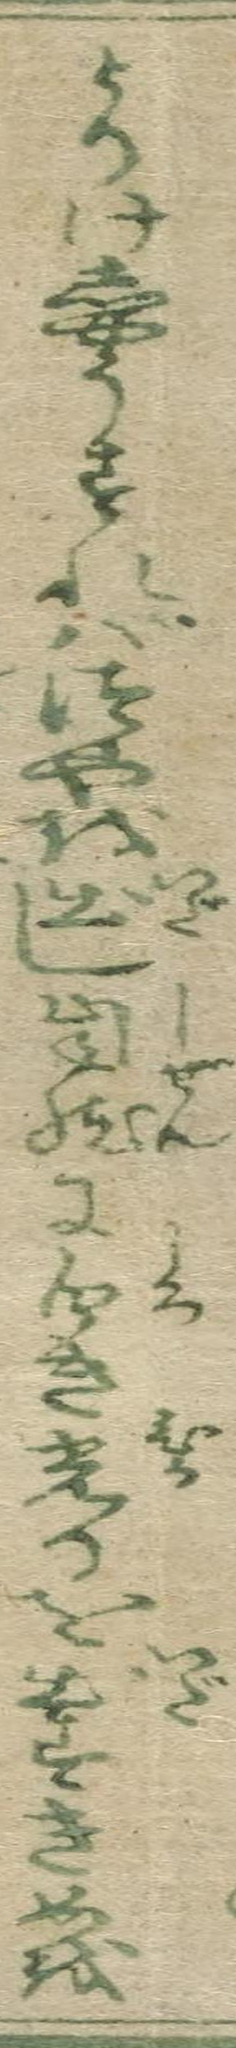とりけしやうすればつやを出し自然に白き光りを出すきめを
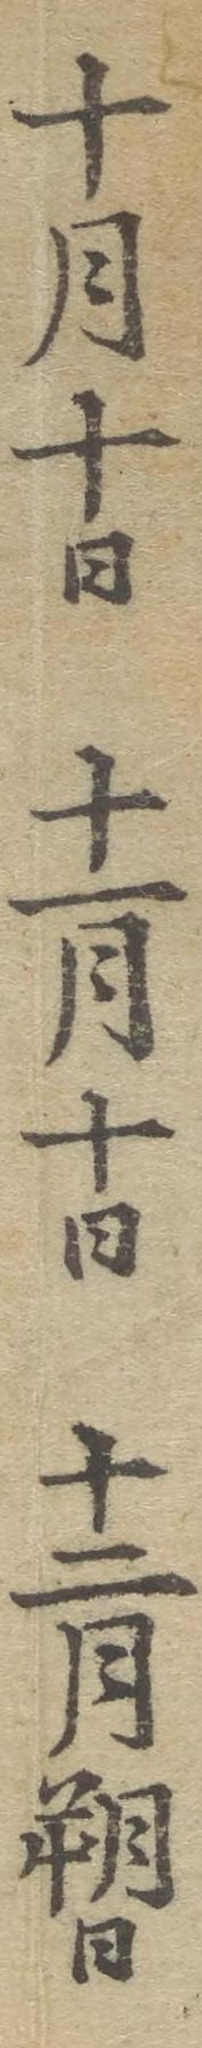十月十日十一月十日十二月朔日
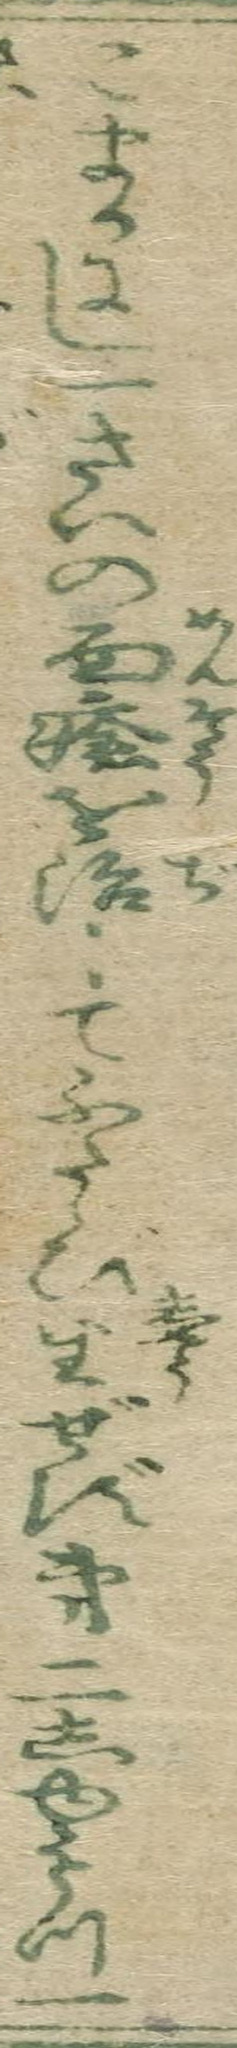こまかにし一さいの面瘡を治してふたゝび生ぜず第二しゆもつ一
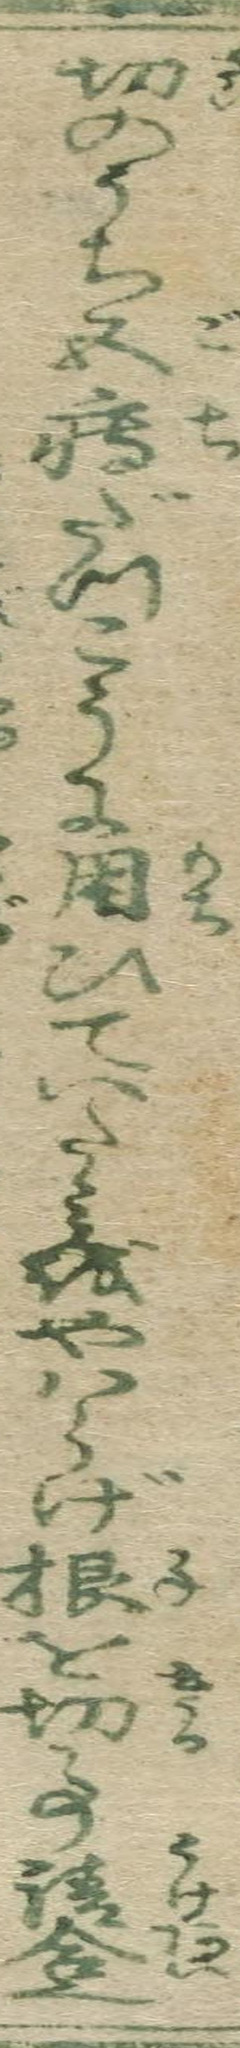切のうち五痔だつこうに用ひていたみをやはらげ根を切事請合也
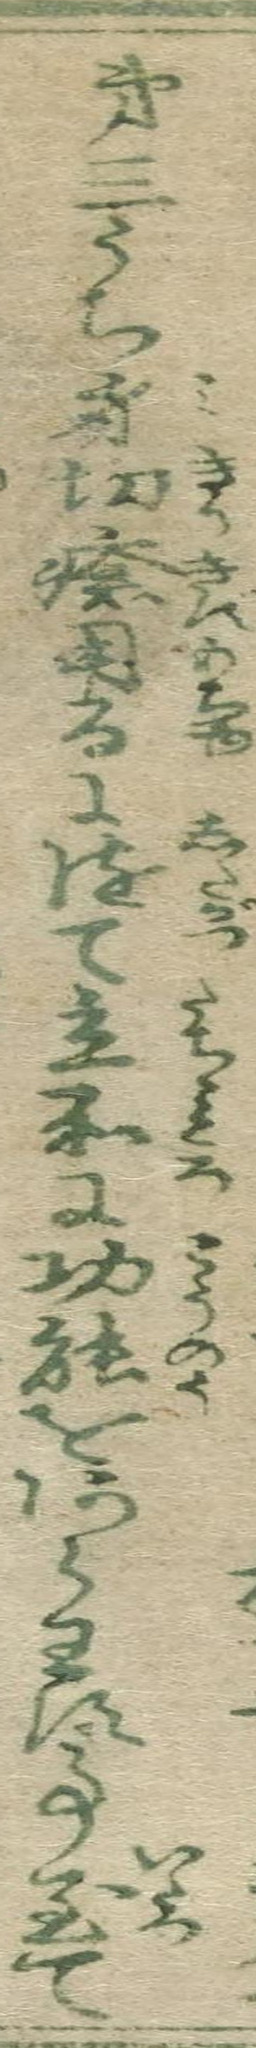第三うち身切癈用るに随て立所に功能をあらわす事至’て
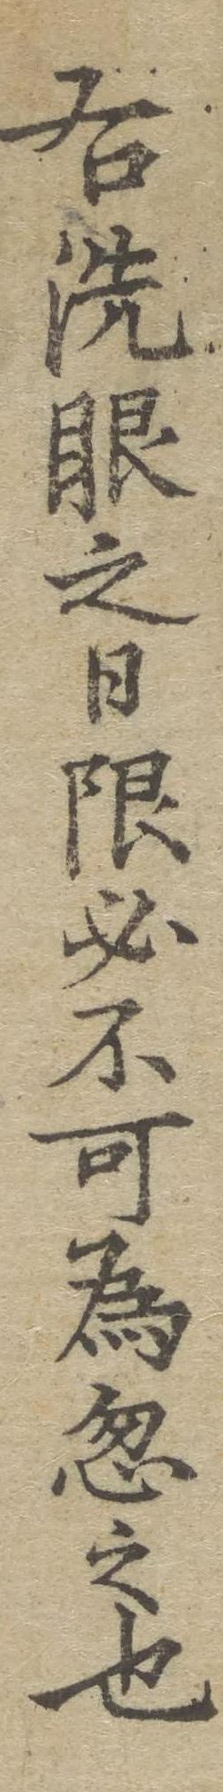右洗眼之日限必不可為忽之也
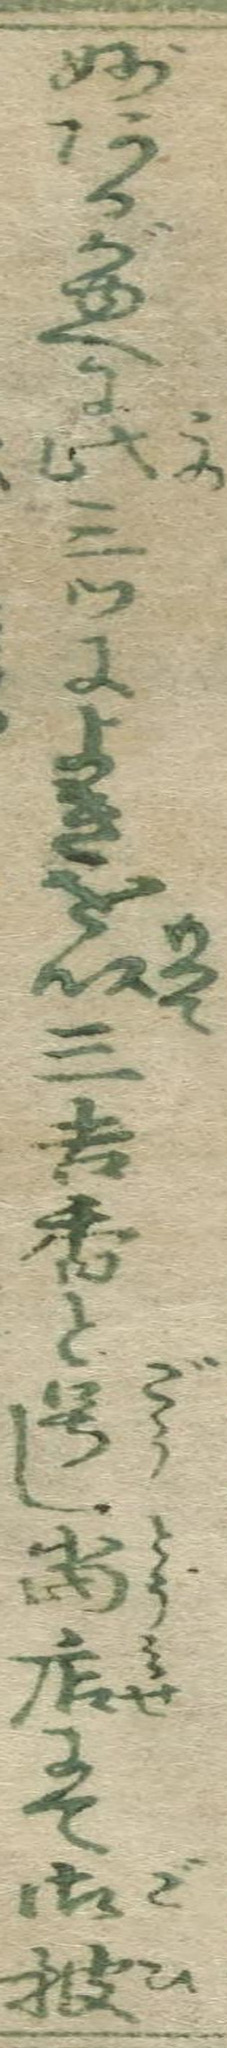妙あるがゆへに此三ツによきを以三吉香と号し当店にて御披
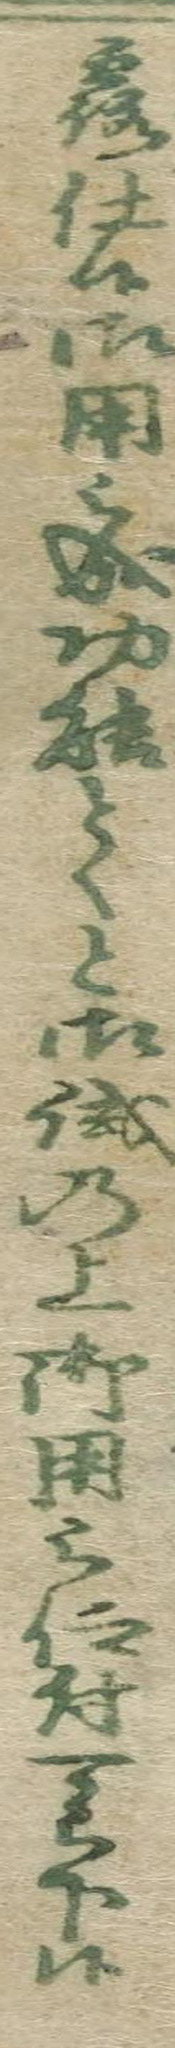露仕候御用被成功能とくと御試の上御用被仰付可被下候
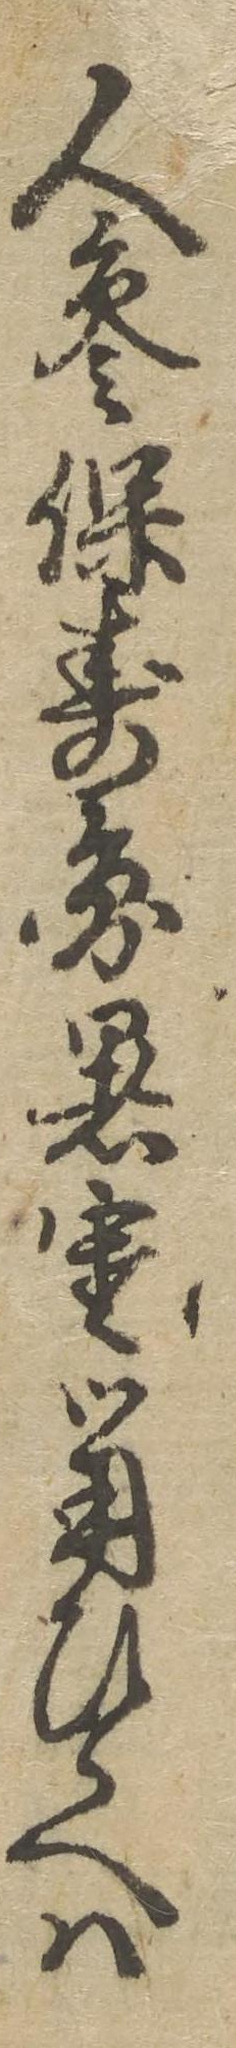人参保寿圓暑寒御用ひ候へは
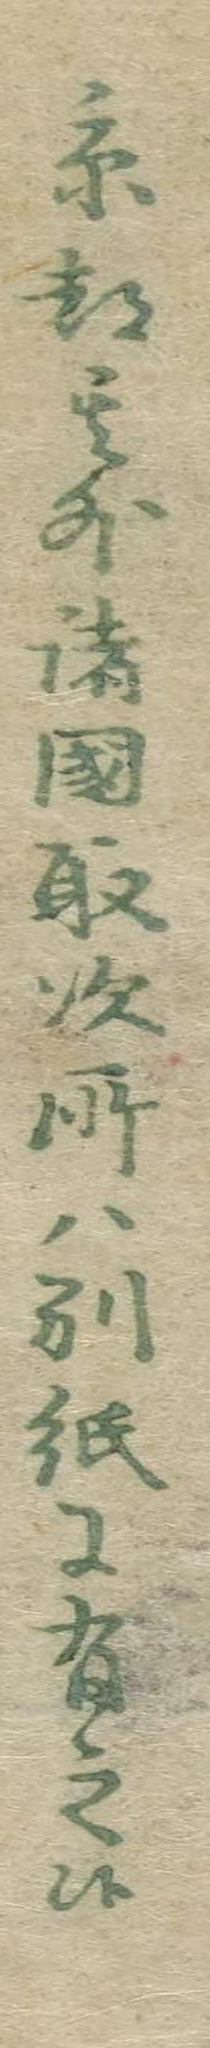京都其外諸国取次所は別紙に有之候
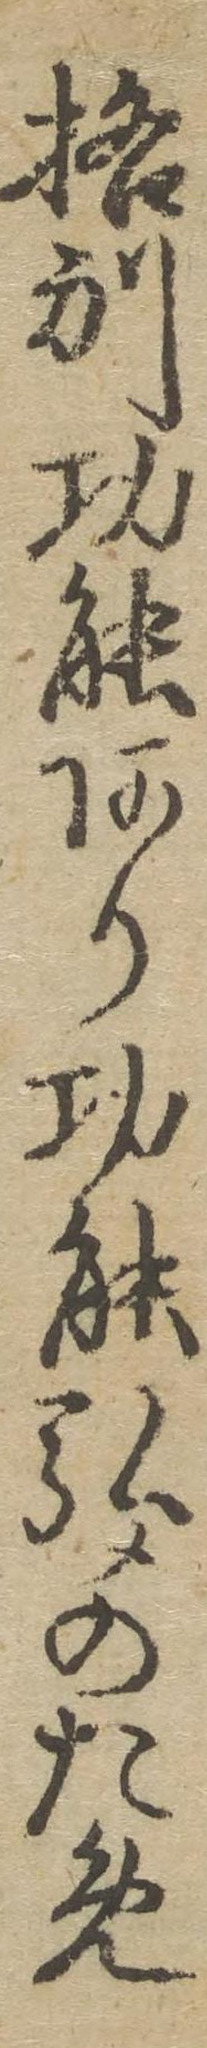格別功能あり功能弘メのため
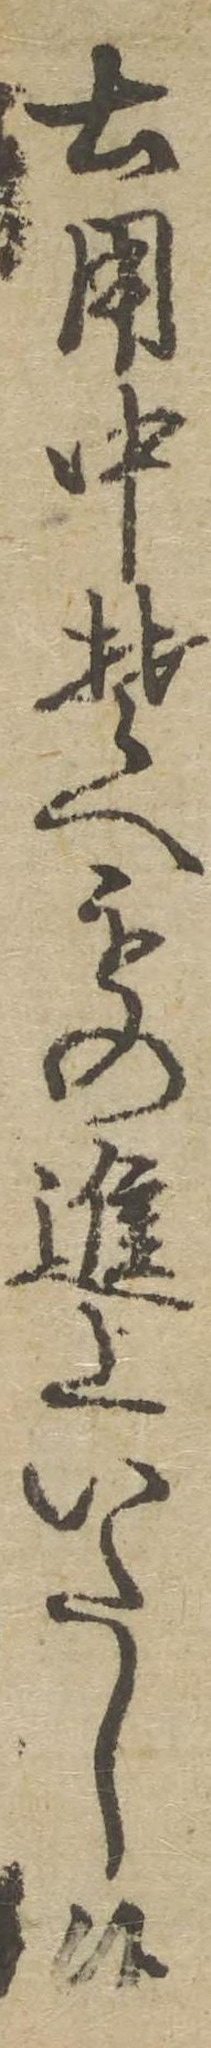右用中そへもの進上いたし候
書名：浪華薬種問屋能書張交帖. 二
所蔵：国立国会図書館 National Diet Library, JAPAN
